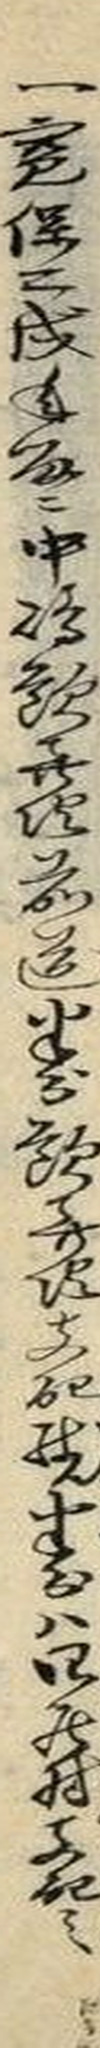一寛保二戌年留に中島歓喜院前道半分歓喜院支配残ル半分は四居村支配之
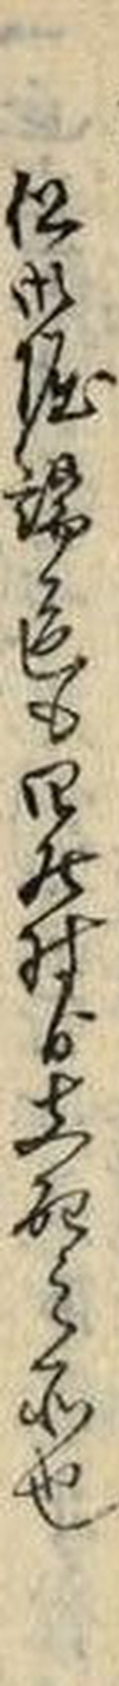但御堀端道も四居村ゟ支配之所也

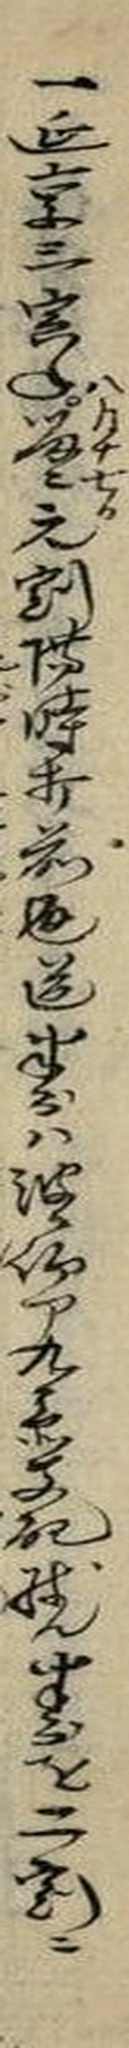一延享三寅年八月十七日留に元割場時打前通道半分は波々伯部九兵衛支配残ル半分を二割に
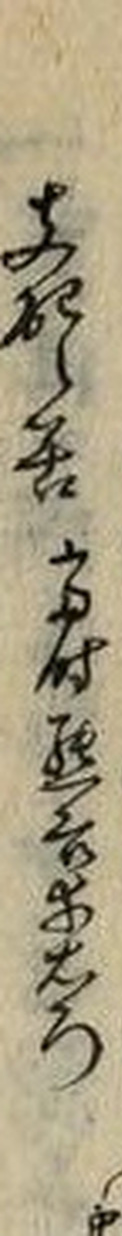支配之筈当時熊谷幸右衛門
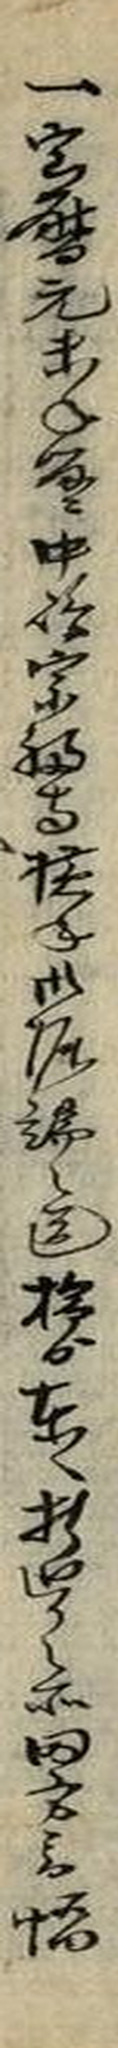一宝暦元未年留に中島宗福寺横手御堀端之道橋ゟ東へ折廻り之所田方にて幅
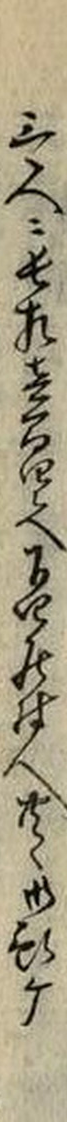三尺に長拾壱間四尺下四居村人共へ御預ケ
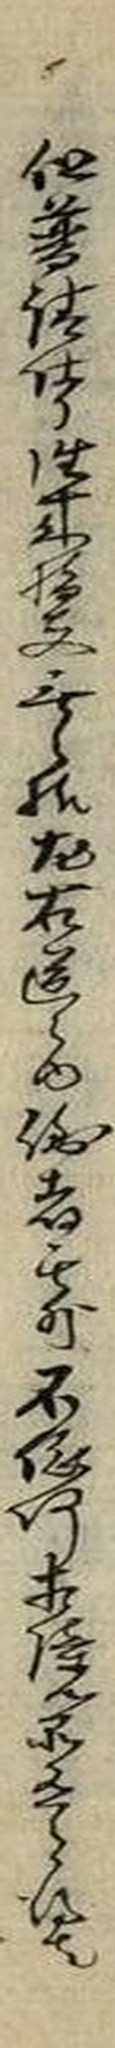但普請仕り往来指支無之様尤右道之内倒者其外不依何相障ル品有之候得は
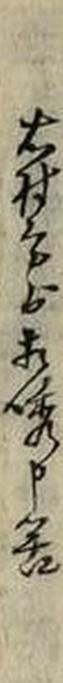右村方ゟ相唀申筈
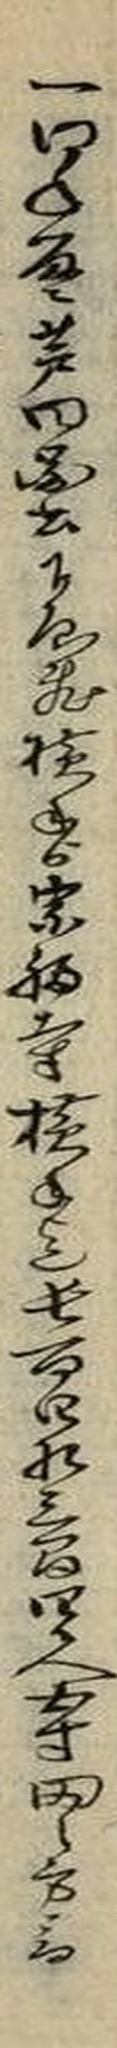一同年留に芦田図書下屋敷横手ゟ宗福寺横手迄長百四拾三間四尺五寸田之方にて
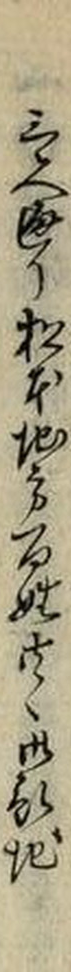三尺通り松本地方百姓共へ御預地
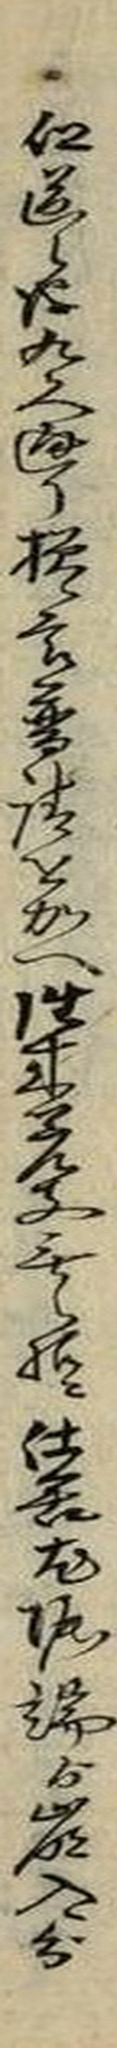但道之儀九尺通り損候節普請を加へ往来差支無之様に仕筈尤堀端ゟ崩入候分
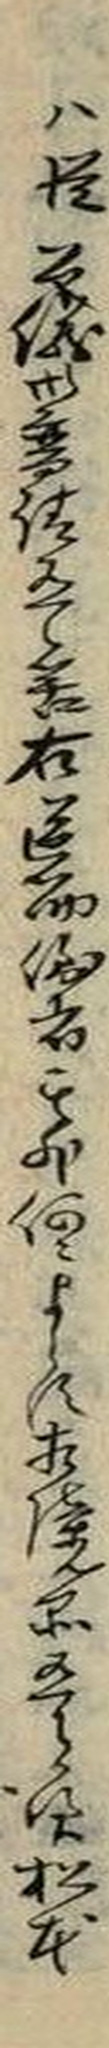は従公儀御普請有之筈右道筋倒者其外何によらす相障ル品有之候得は松本
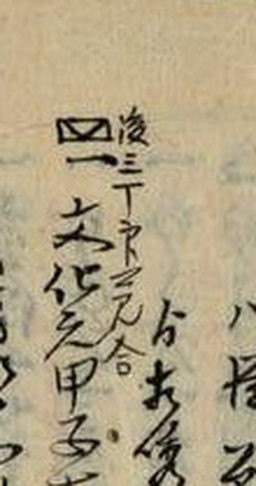後三丁印可見合
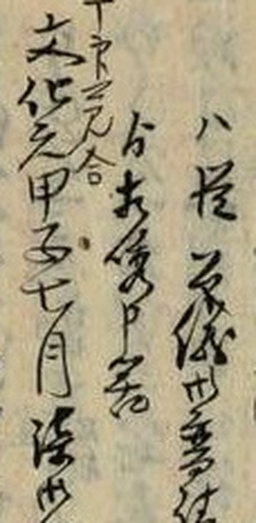ゟ相唀申筈
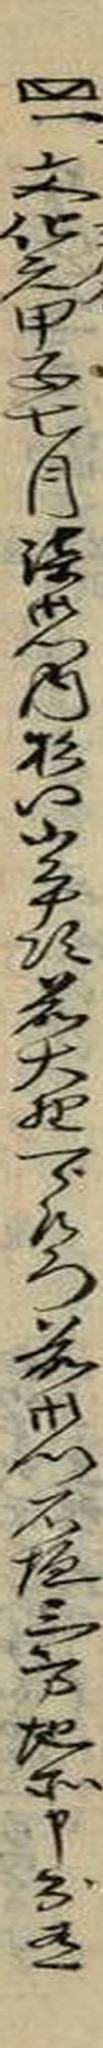一文化元甲子七月漆御門内杉田小平次前大野一郎左衛門前御門石垣三方地所申分有
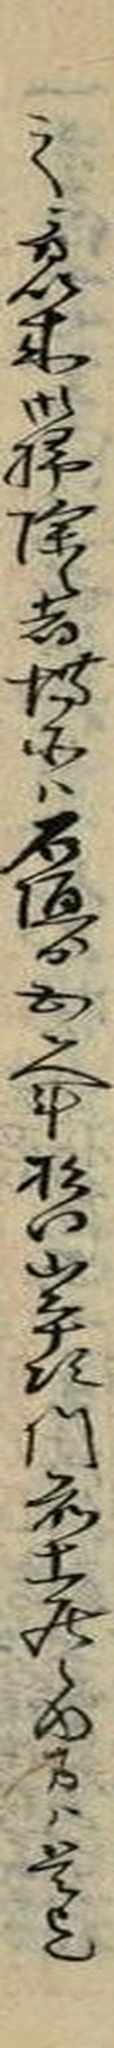之に付以来御掃除之者場所は石垣ゟ五尺斗杉田小平次門前土居之内方は是迄
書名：御城下諸事之部
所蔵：福井県文書館 Fukui Prefectural Archives
